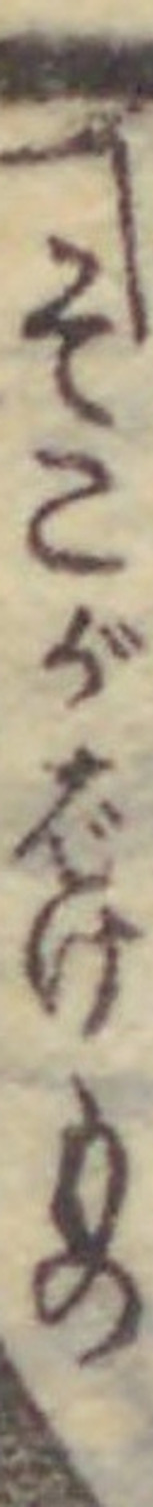〽そこがばけもの
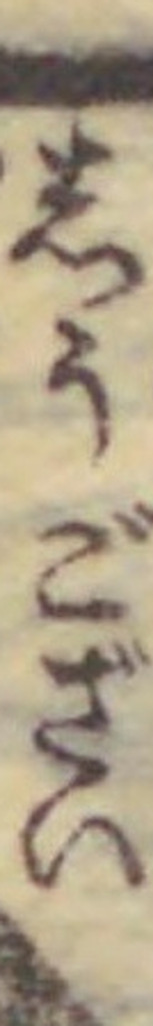しうござい
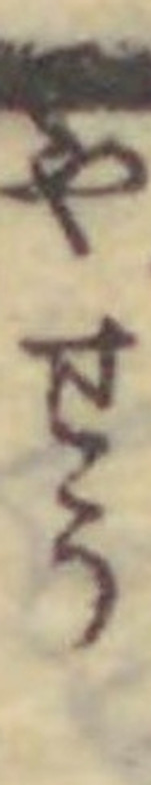やせう
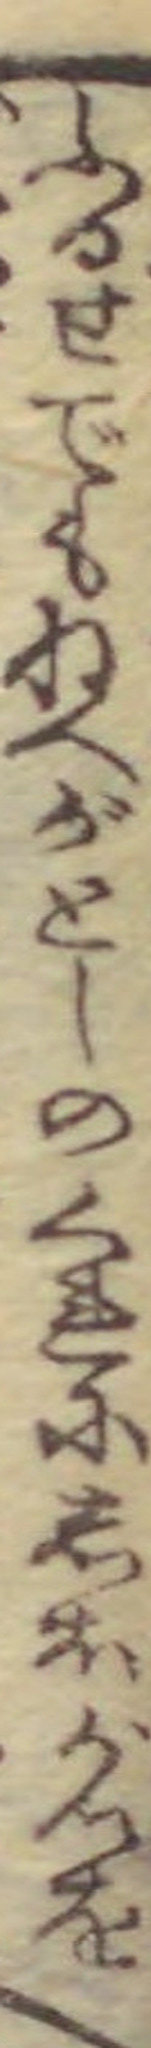ふるせでもねへがとしのくれにしほがつを
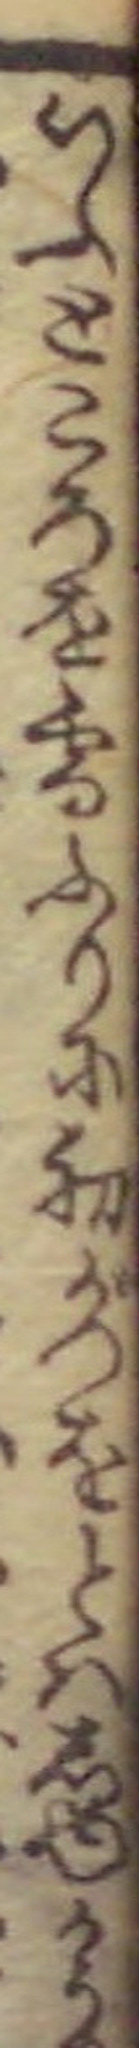いふところを雪ふりに初がつをとはしゆかうは
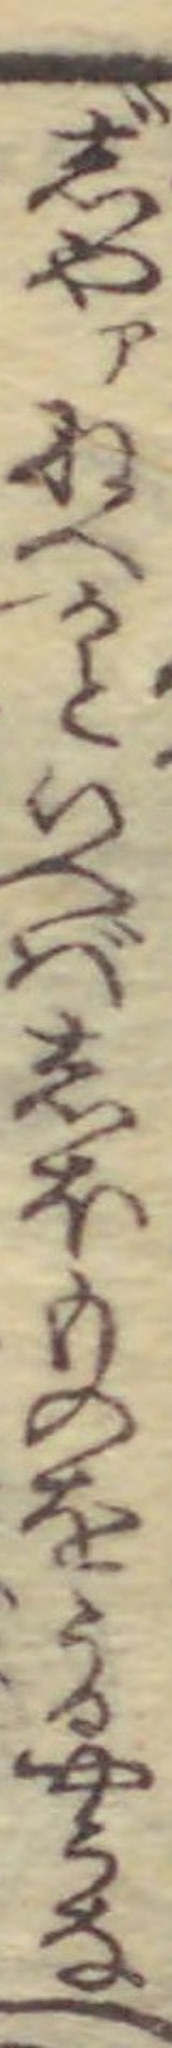じやァねへかといへばしほものをうるやうな
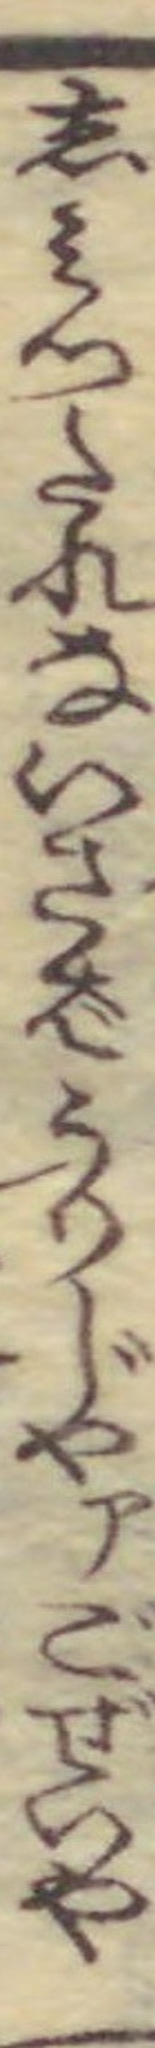しみつたれないさばうりじやァごぜいや
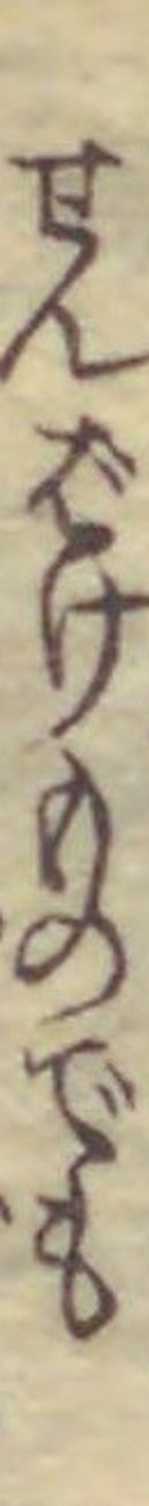せんばけものでも
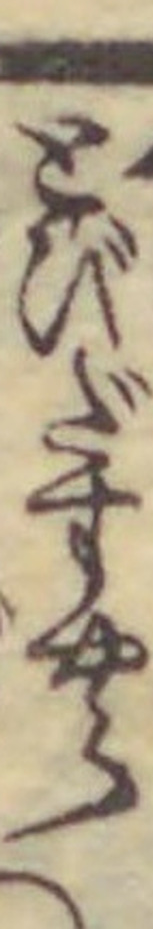とびだすやら
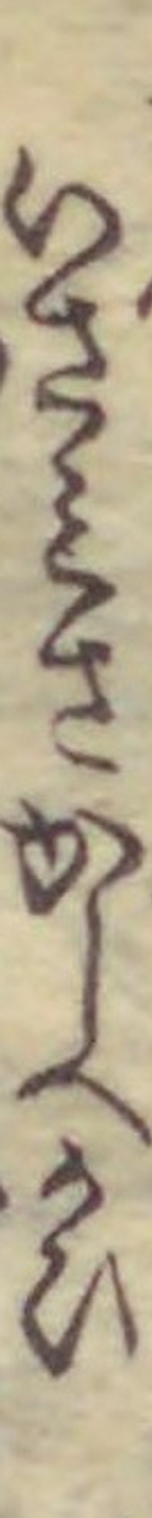いさみさかしへかひ
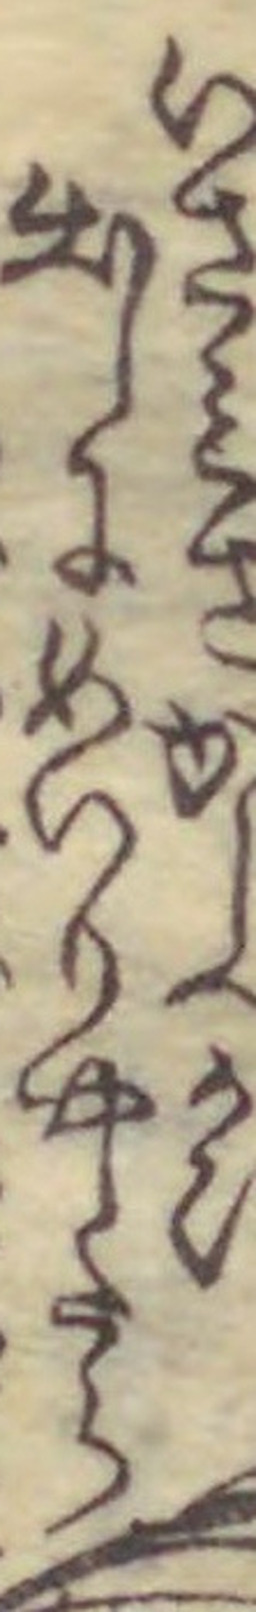出しにめいりやしたら
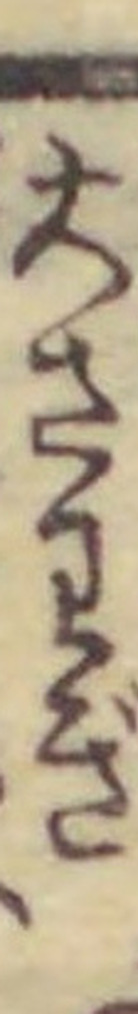大さわぎ
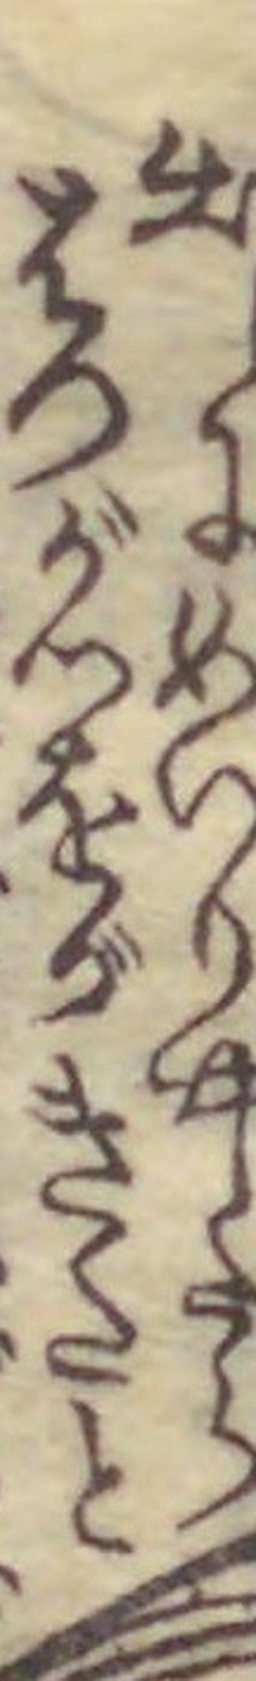はつがつをがきたと
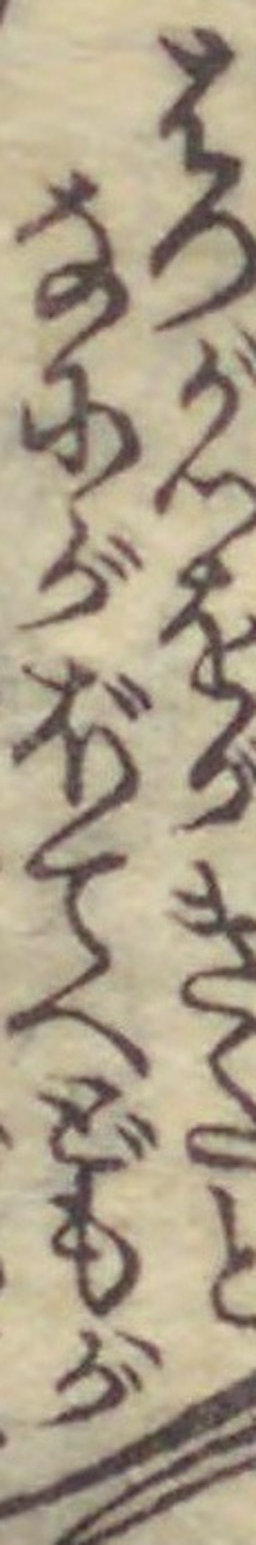なにがぼてへどもが
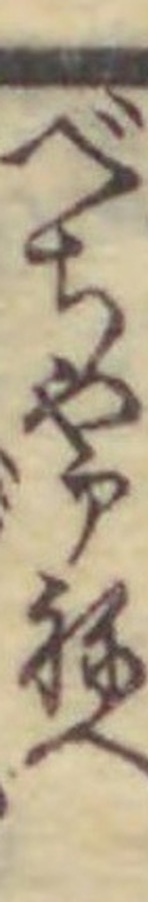べちやァねへ
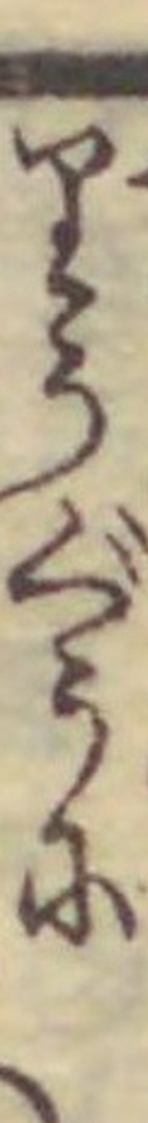りうぐうに
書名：大時代唐土化物 3巻. 曽我太夫染
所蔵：国立国会図書館 National Diet Library, JAPAN
